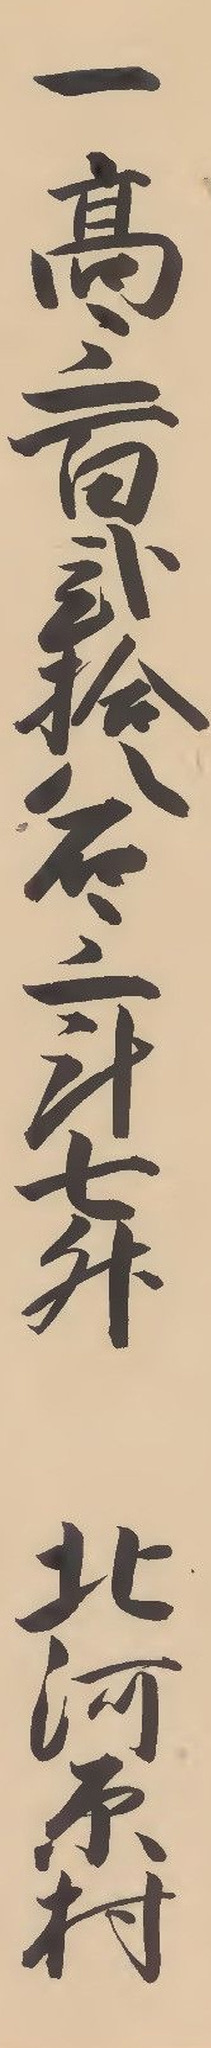一高三百弐拾八石三斗七升北河原村
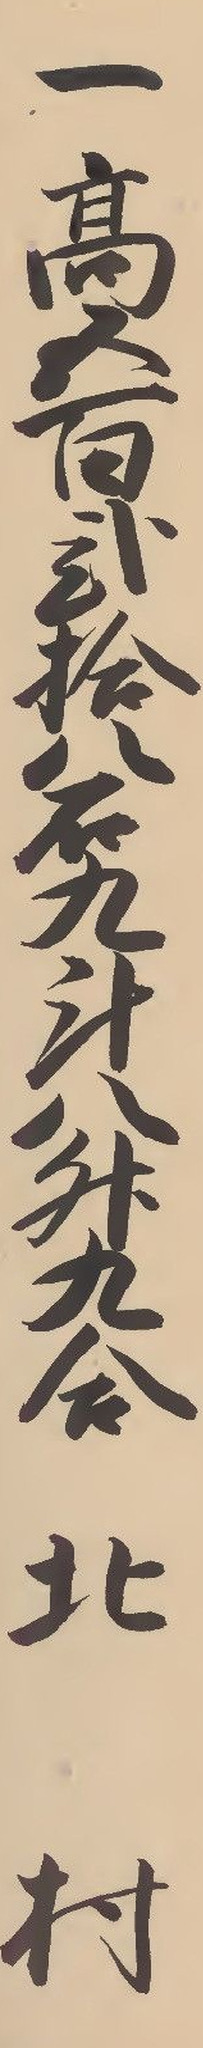一高五百弐拾八石九斗八升九合北村
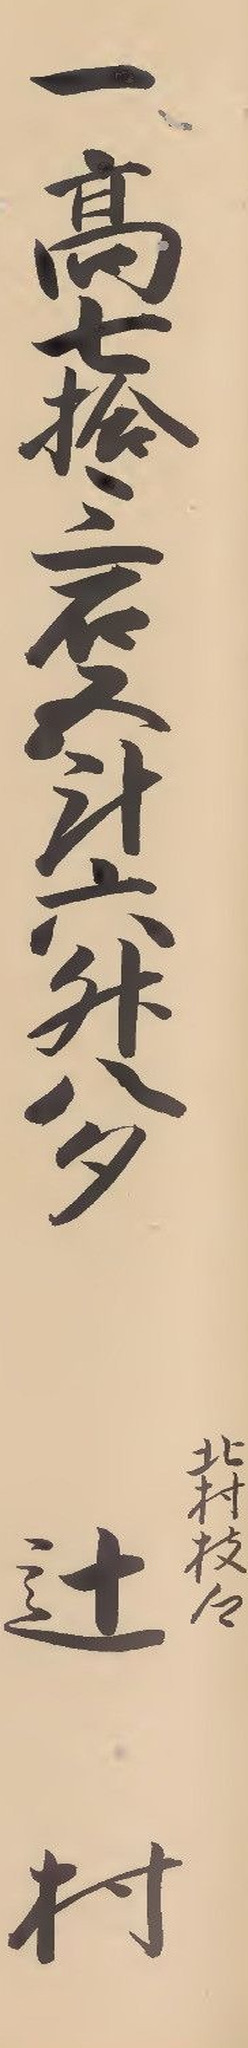一高七拾三石五斗六升八勺辻村
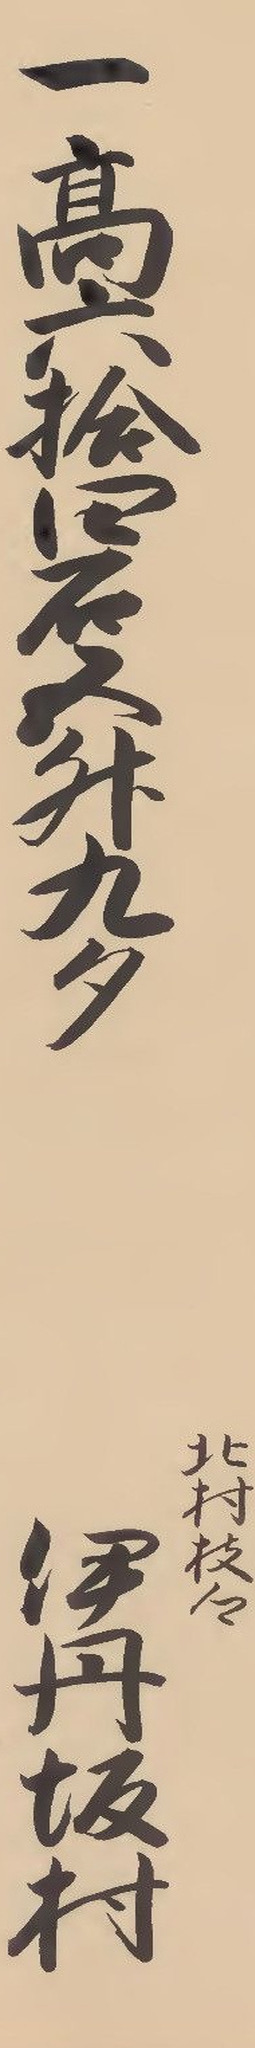一高六拾四石五升九勺伊丹坂村
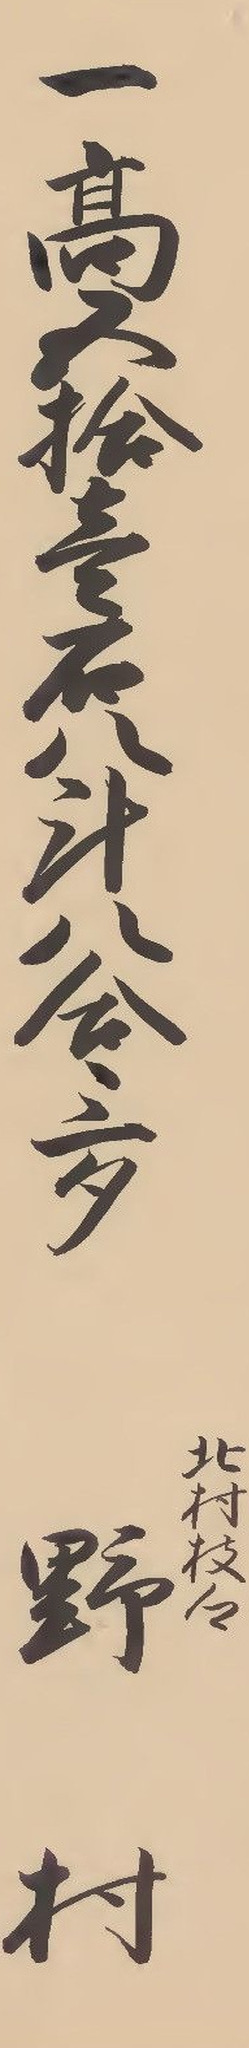一高五拾壱石八斗八合三勺野村
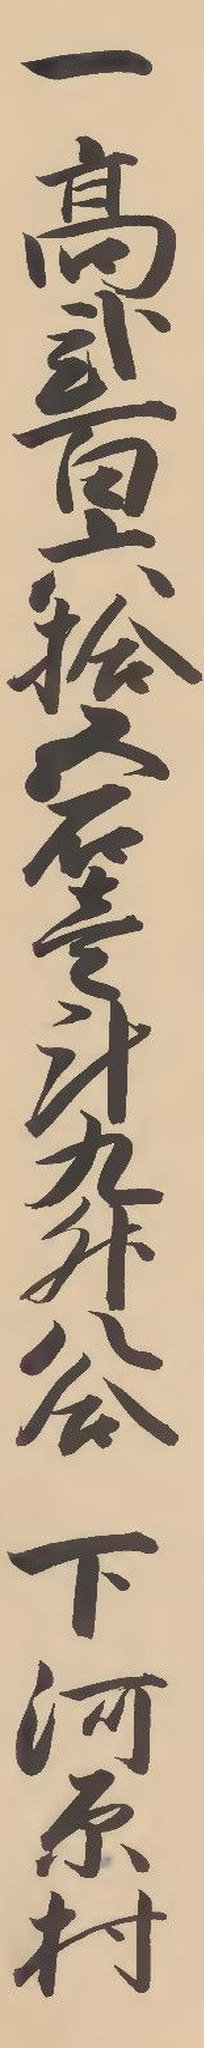一高弐百六拾五石壱斗九升八合下河原村

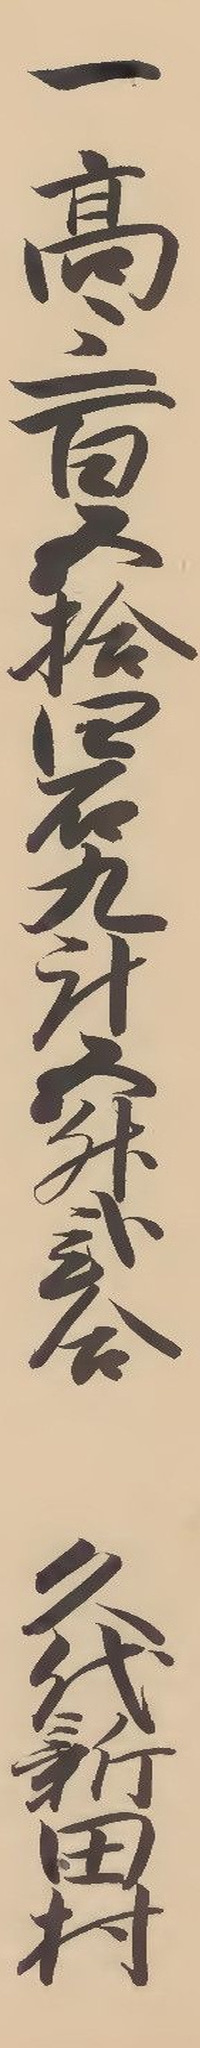一高三百五拾四石九斗五升弐合久代新田村
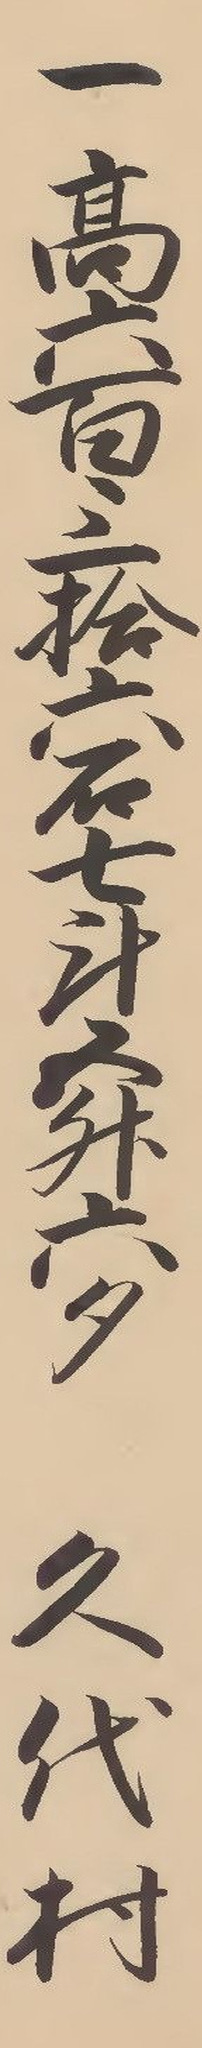一高六百三拾六石七斗五升六勺久代村
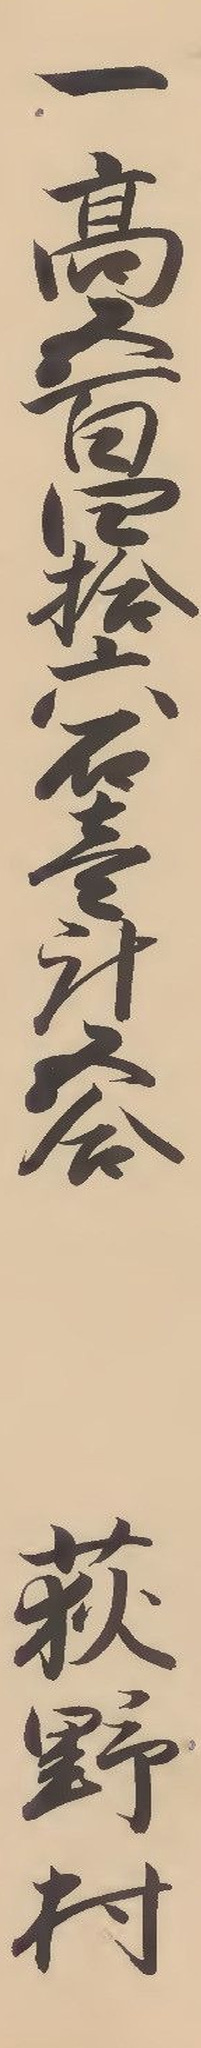一高五百四拾六石壱斗五合萩野村
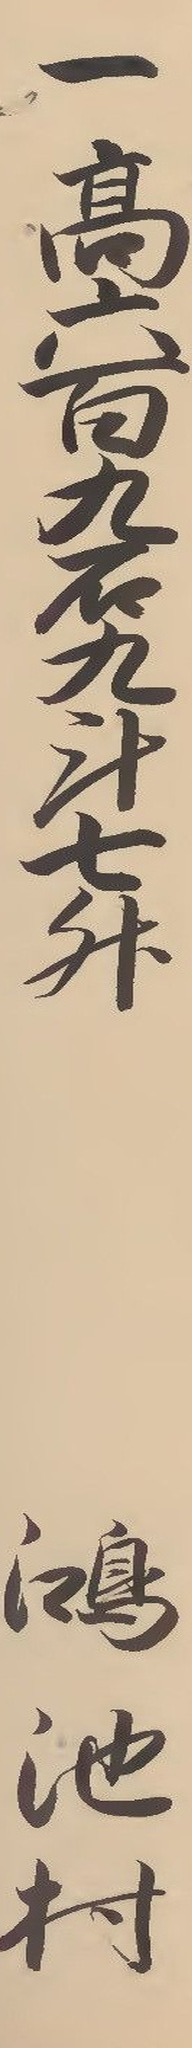一高六百九石九斗七升鴻池村
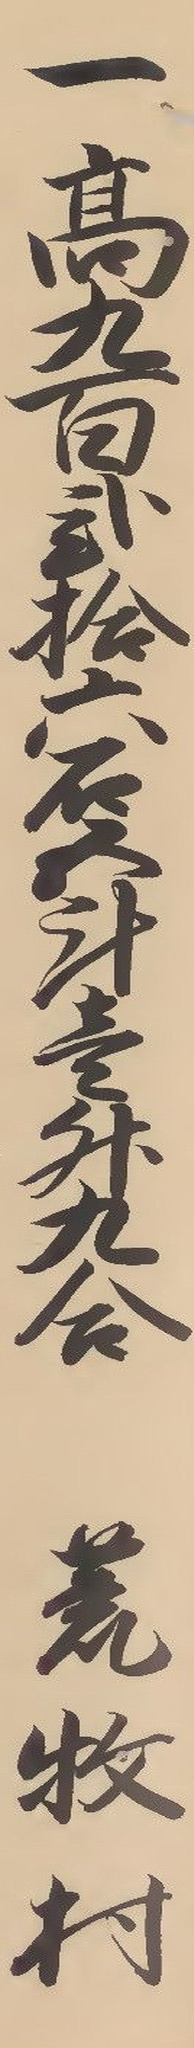一高九百弐拾六石五斗壱升九合荒牧村
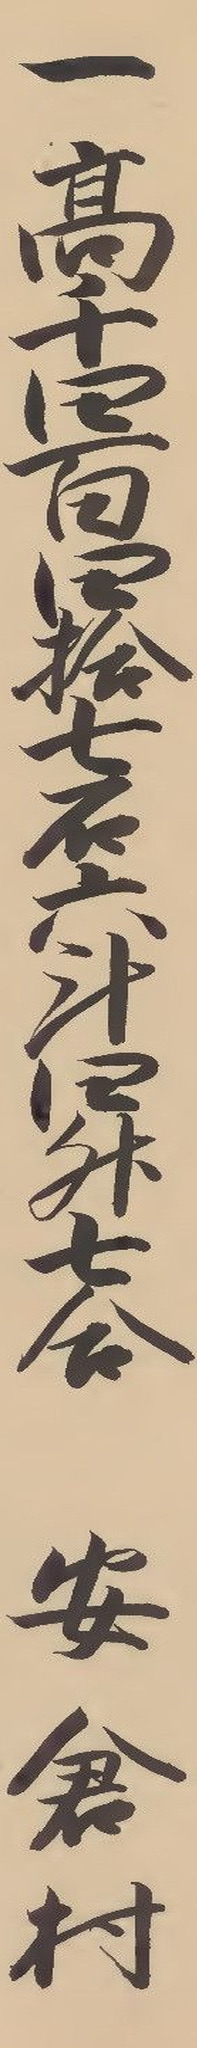一高千四百四拾七石六斗四升七合安倉村
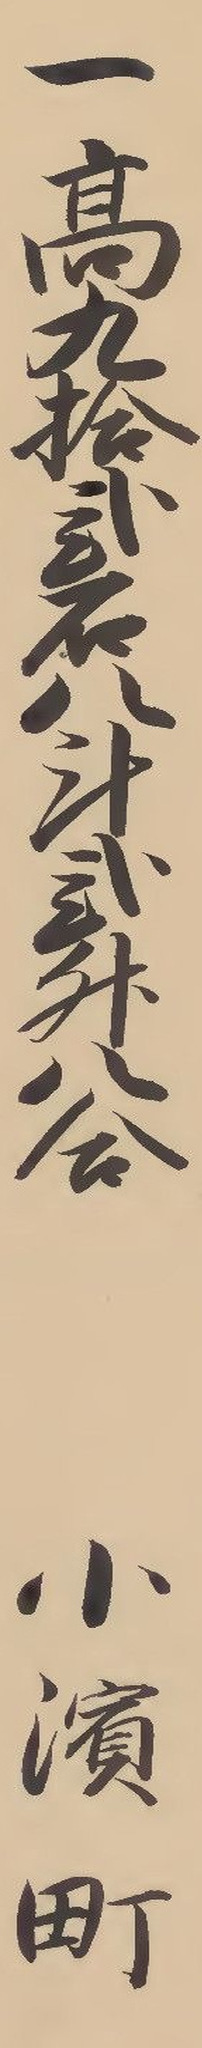一高九拾弐石八斗弐升八合小浜町
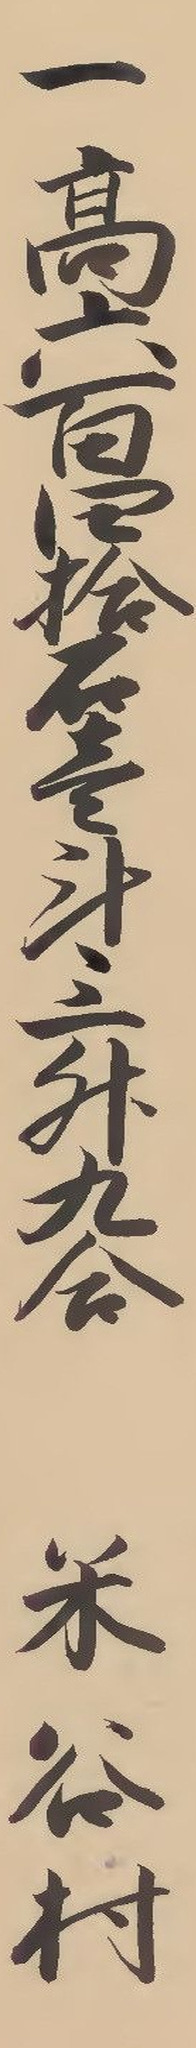一高六百四拾石壱斗三升九合米谷村

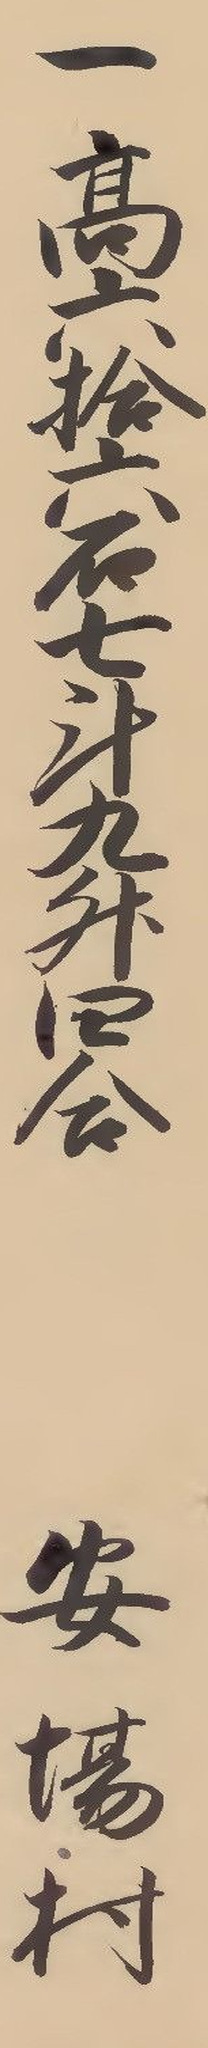一高六拾六石七斗九升四合安場村
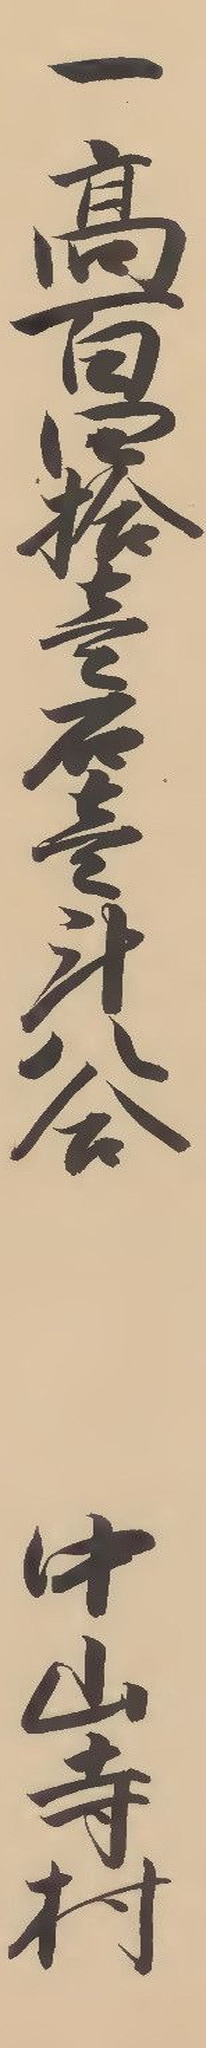一高百四拾壱石壱斗八合中山寺村
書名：摂津国郷帳
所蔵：国立公文書館 National Archives of Japan
